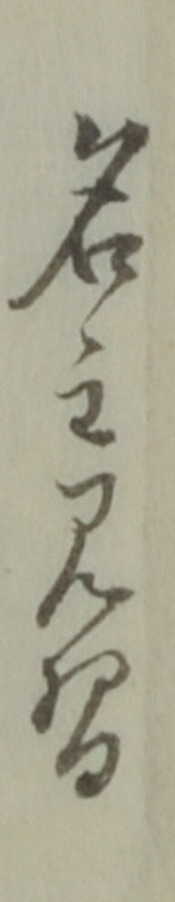名主見習
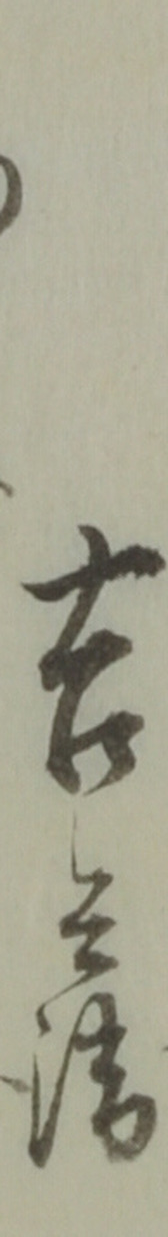六兵衛
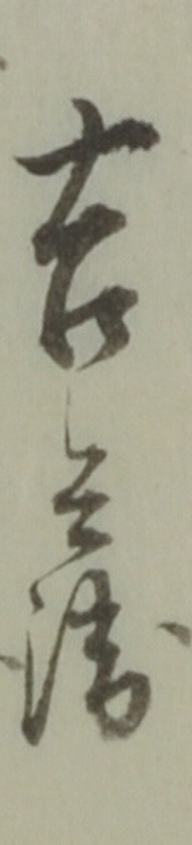六兵衛
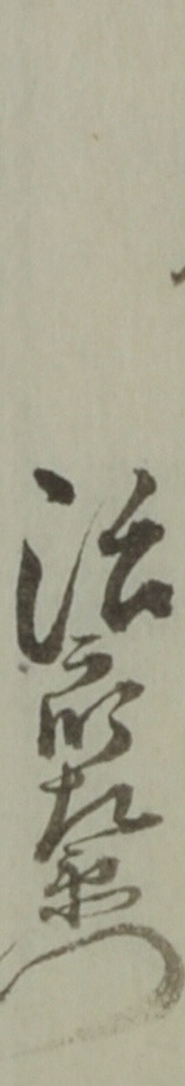治郎左衛門
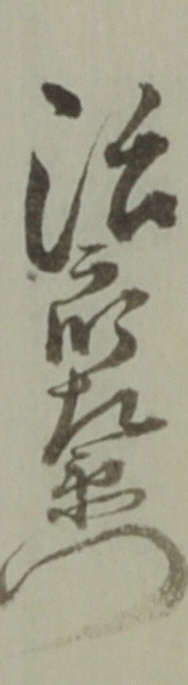治郎左衛門
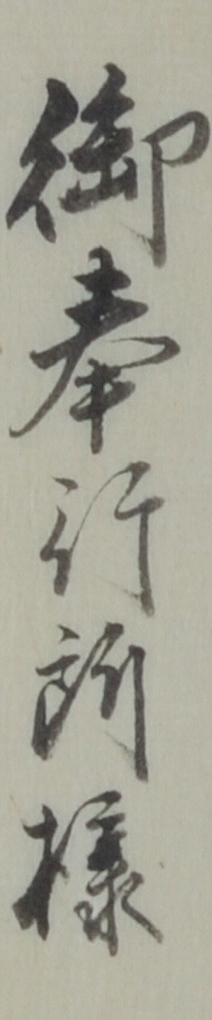御奉行所様
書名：當町持馬書上帳
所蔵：伊那市立高遠町図書館・合同会社AMANE
